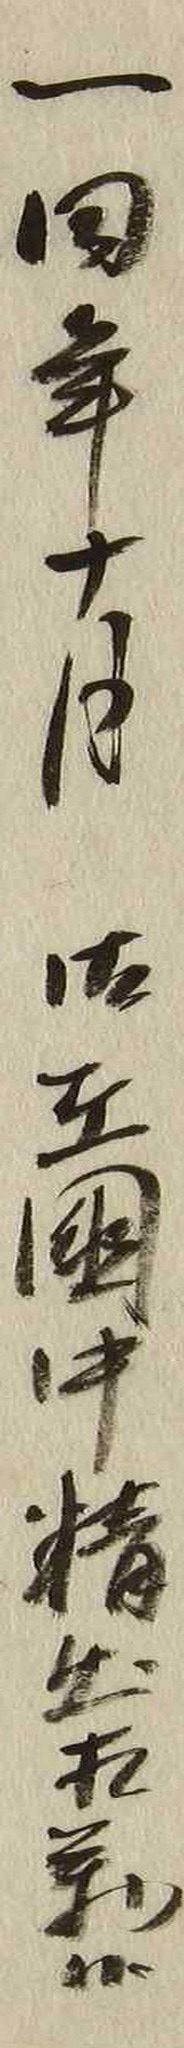一同年十月御在国中精出相勤候
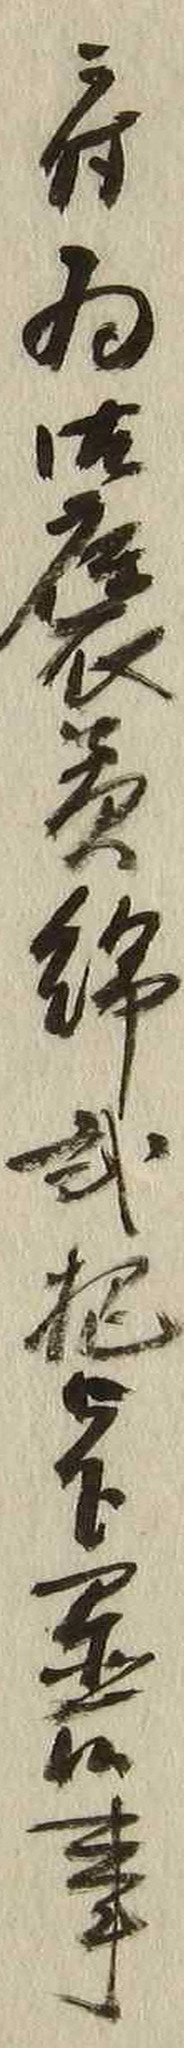に付為御褒美綿弐把被下置候事
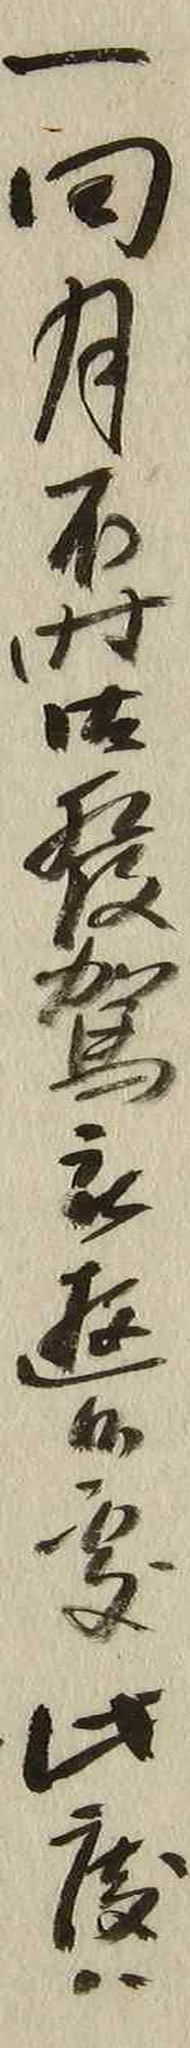一同月不時御発駕被遊候処此度は
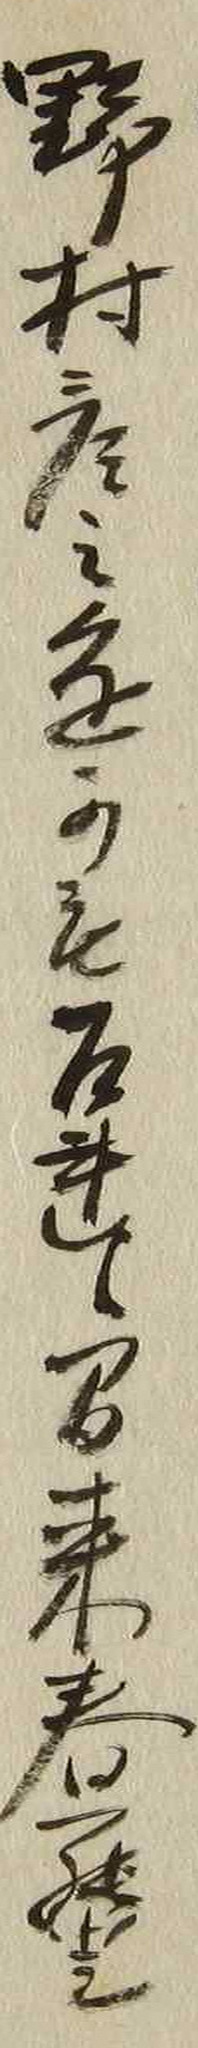野村彦之進可被召連候間來春罷登
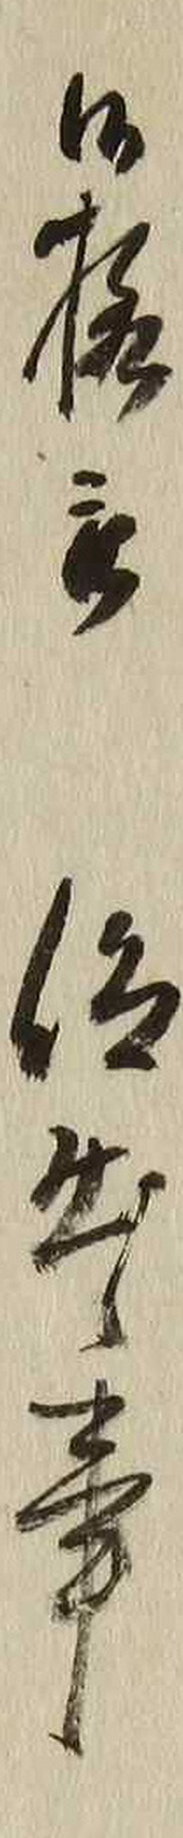候様被仰出候事
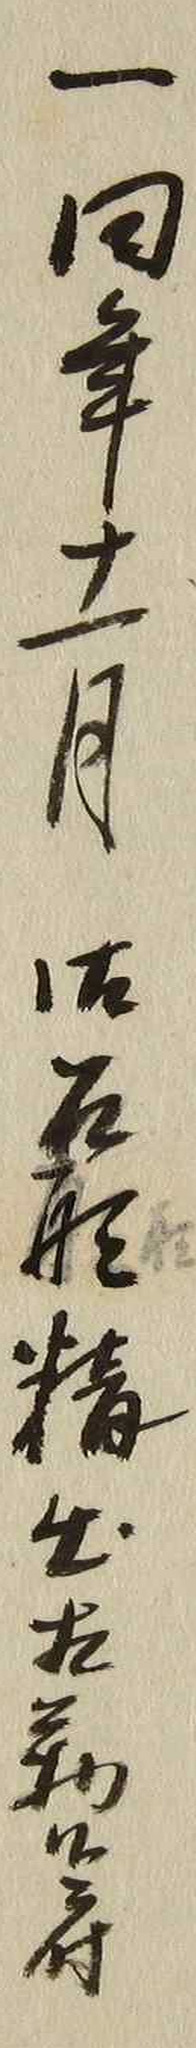一同年十一月御召形精出相勤候に付
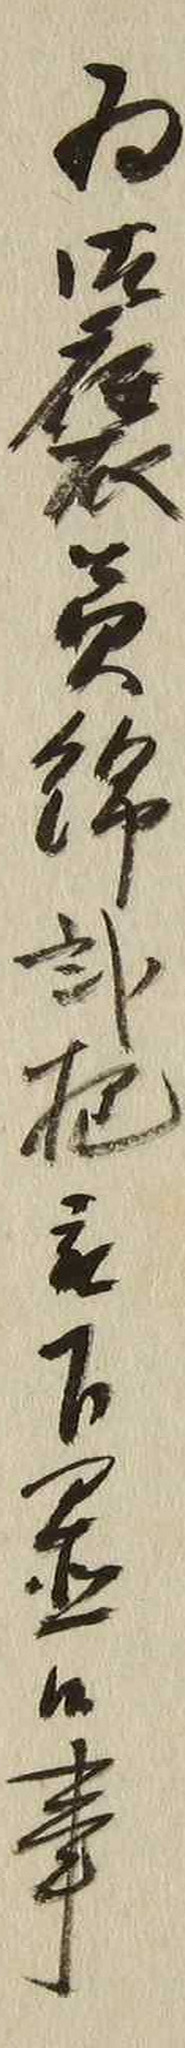為御褒美綿弐把被下置候事
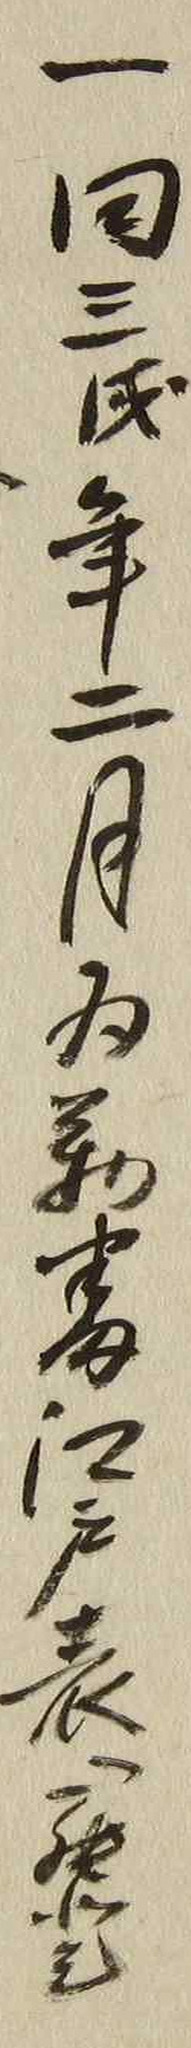一同三戊年二月為勤番江戸表へ罷登
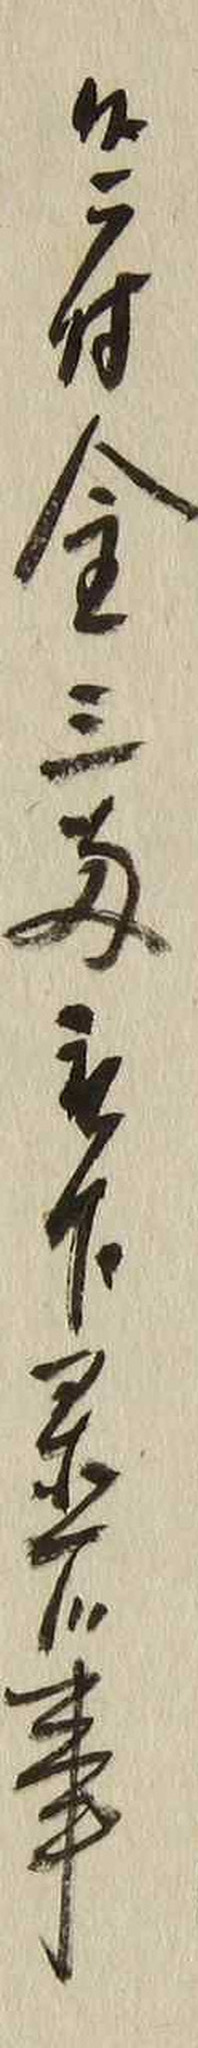候に付金三両被下置候事
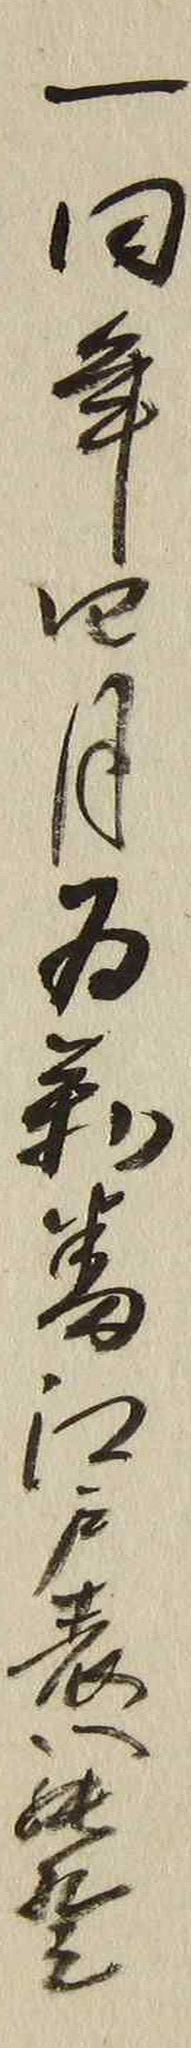一同年四月為勤番江戸表へ罷登
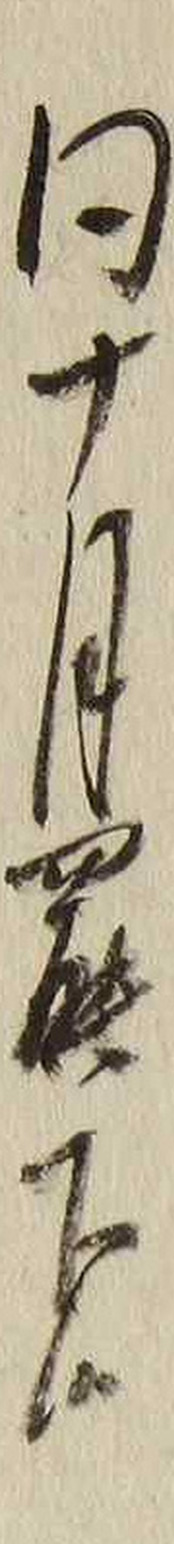同十月罷下候
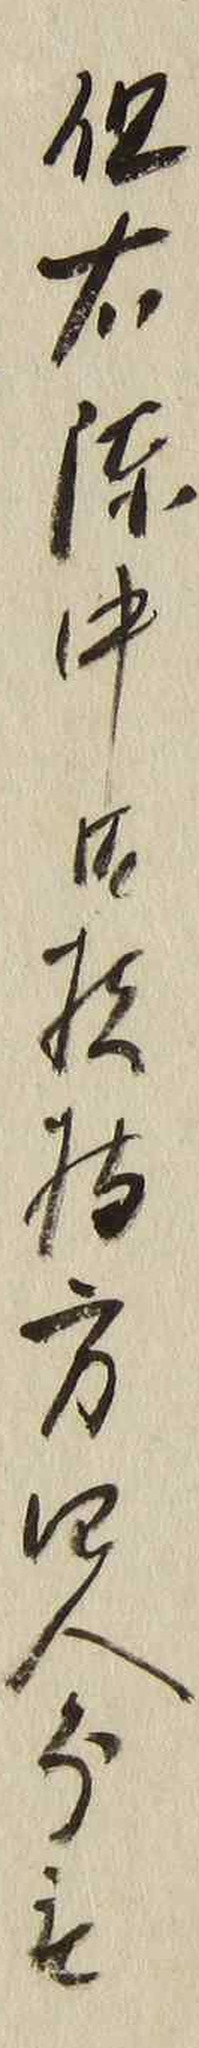但右陣中御扶持方四人分被
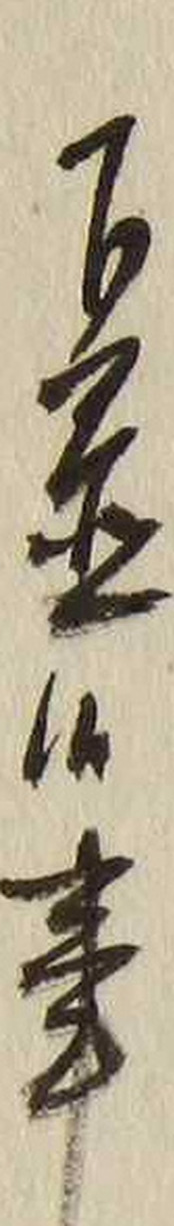下置候事
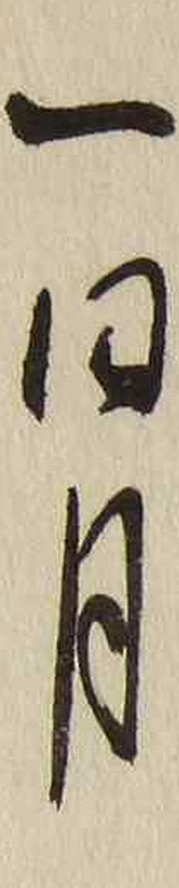一同月

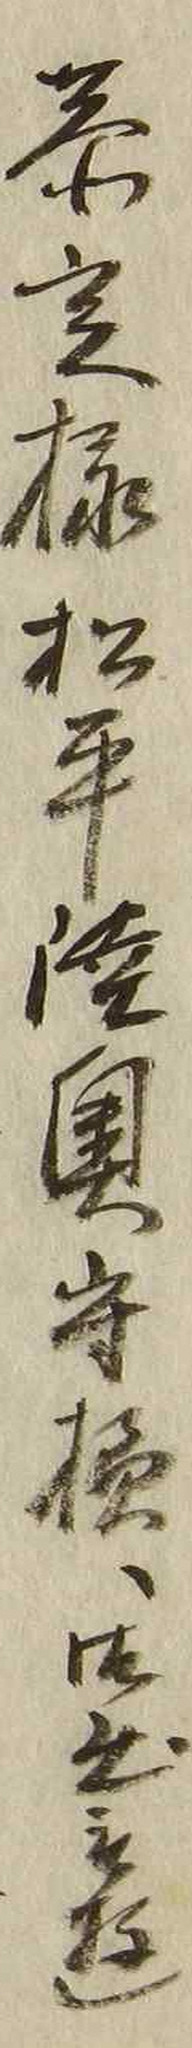恭定様松平陸奥守様へ罷出被遊
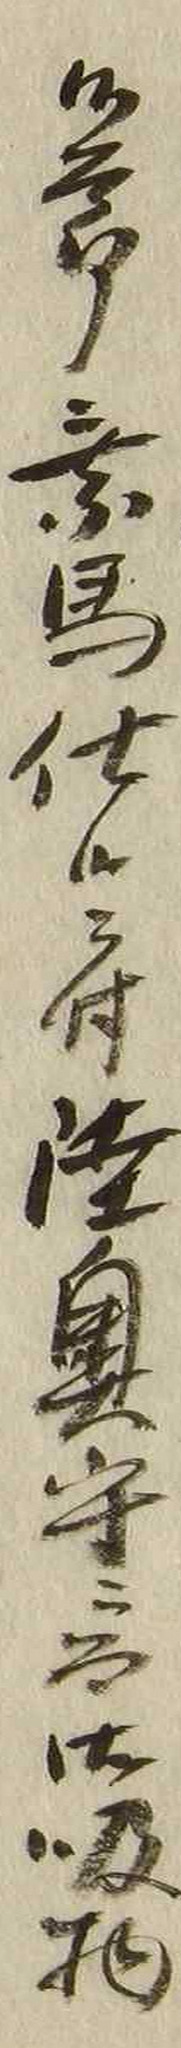候節乗馬仕候に付陸奥守に而御吸物
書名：諸士系譜　巻之360　す之部10
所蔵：会津若松市立会津図書館
